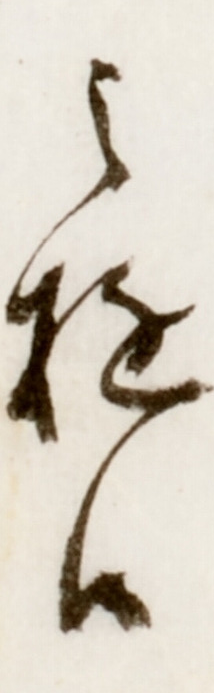被遊候
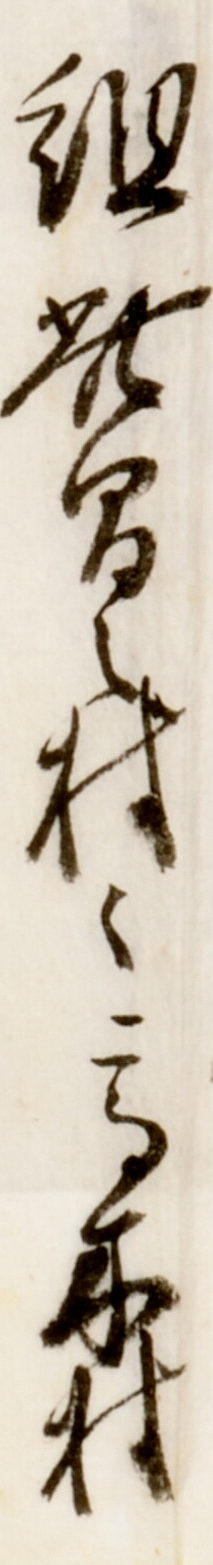但此間之村々高木村
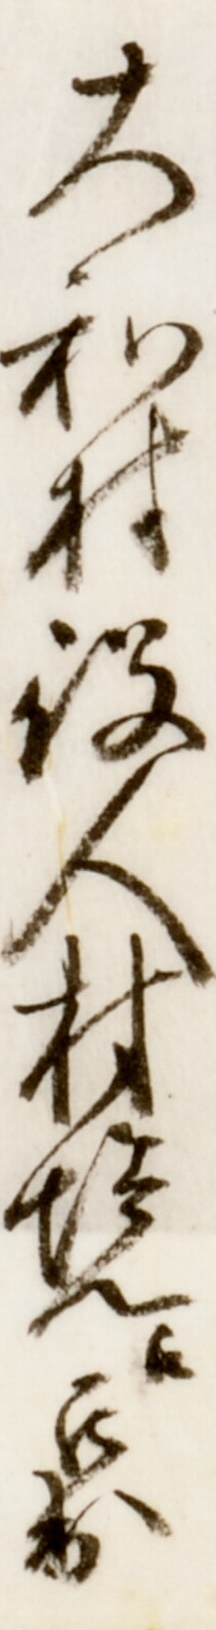大和村役人村境江罷出
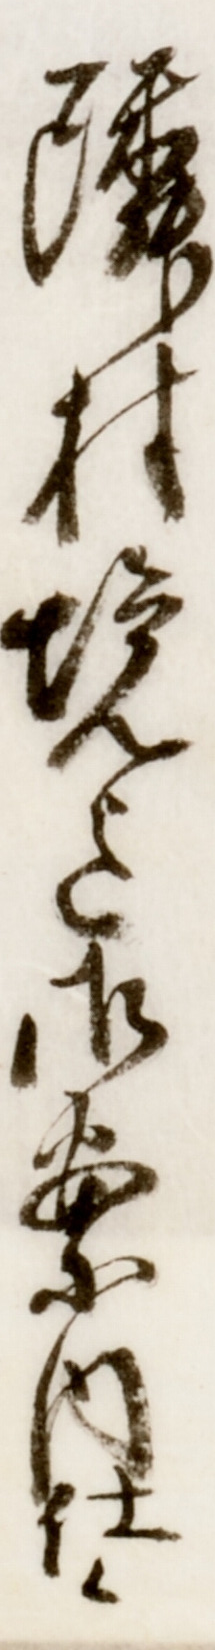隣村境迄御案内仕候
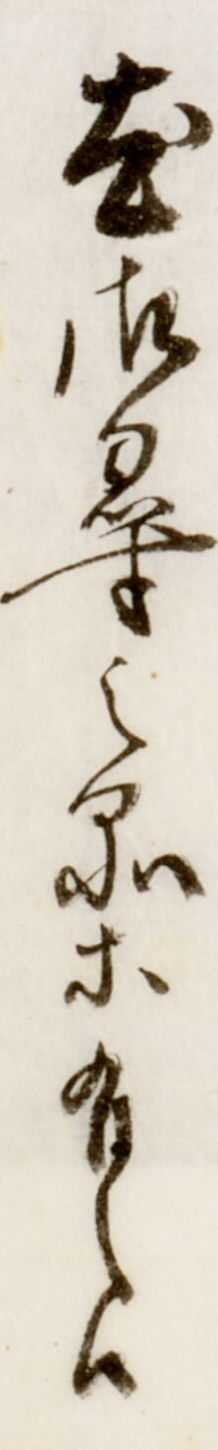尤御尋之品等有之候
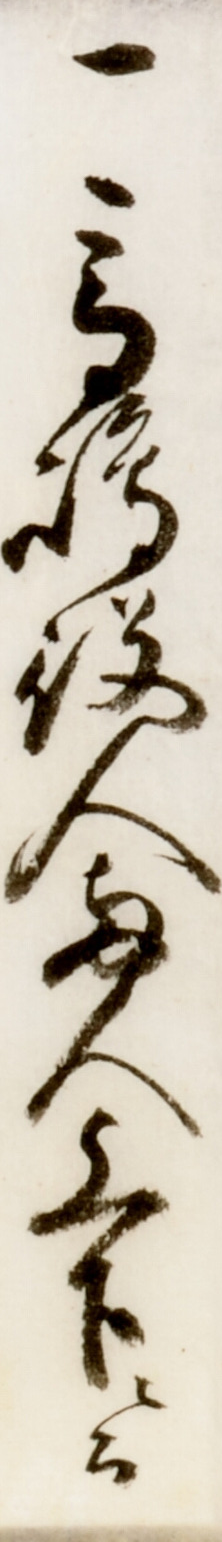一高嶋役人両人上下ニ而
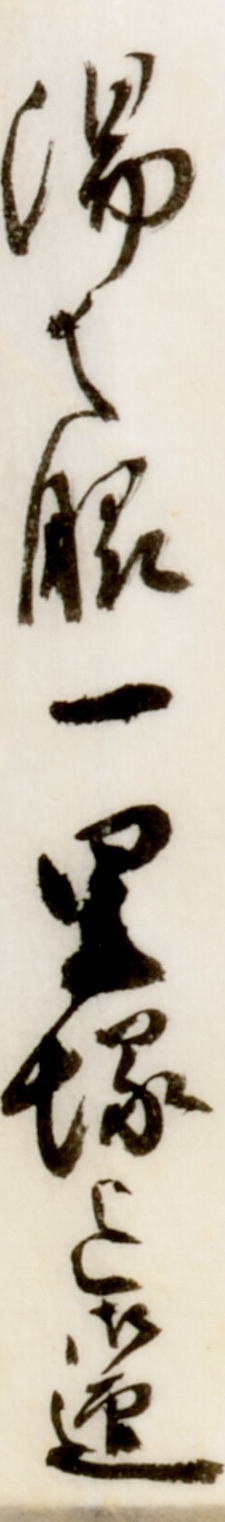湯之脇一里塚迄御迎
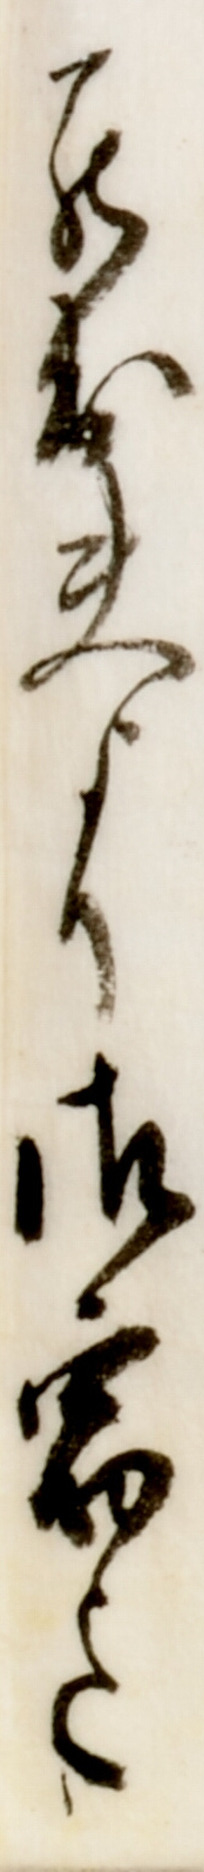罷出夫より御宿迄
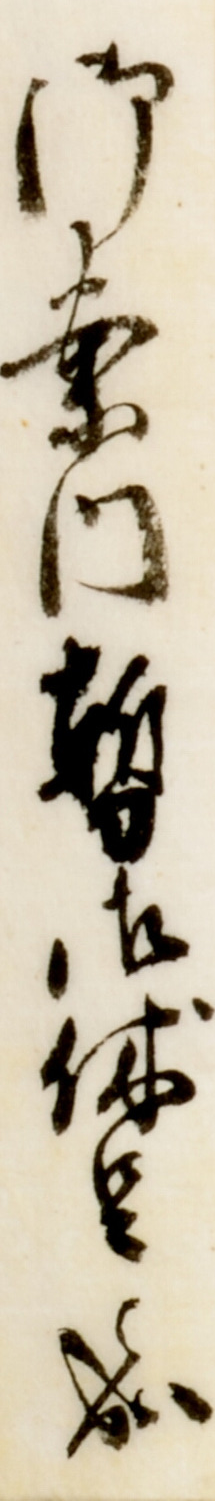御案内、暫御休足被成
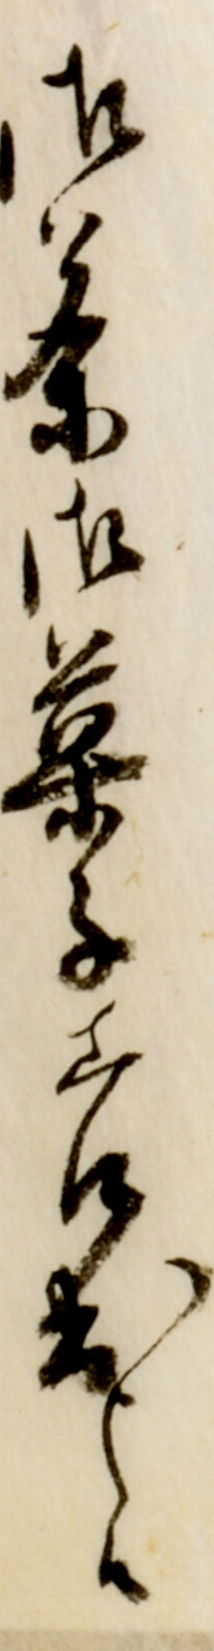御茶・御菓子差出申候

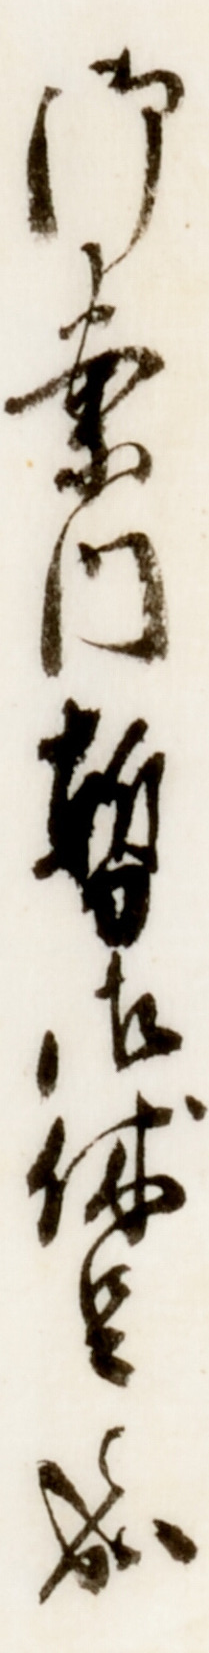御案内暫御休足被成
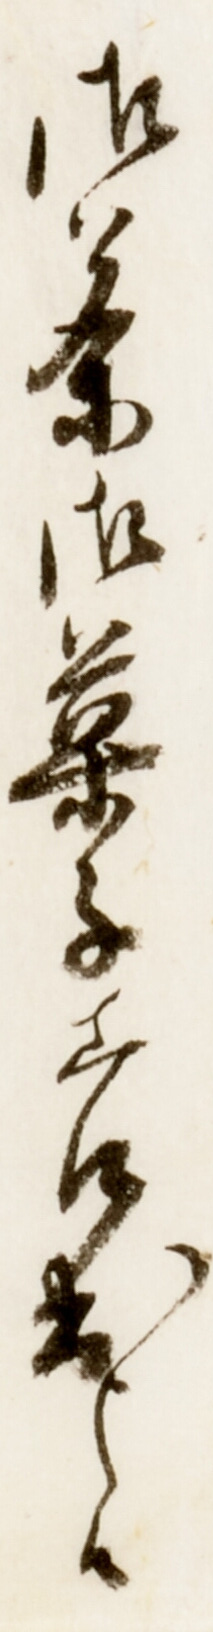御茶御菓子差出申候
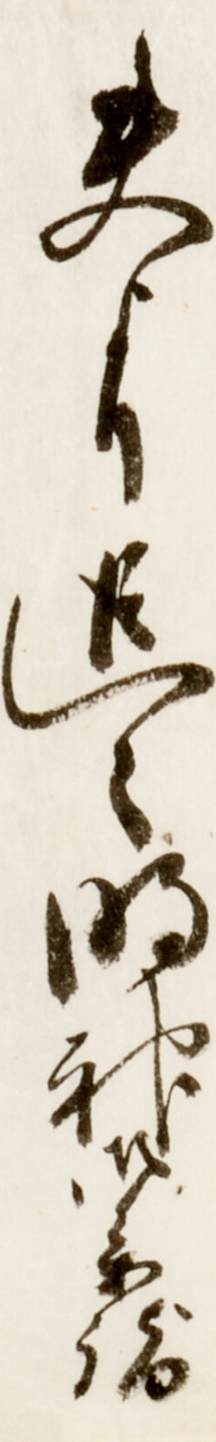夫より追々明神御参詣
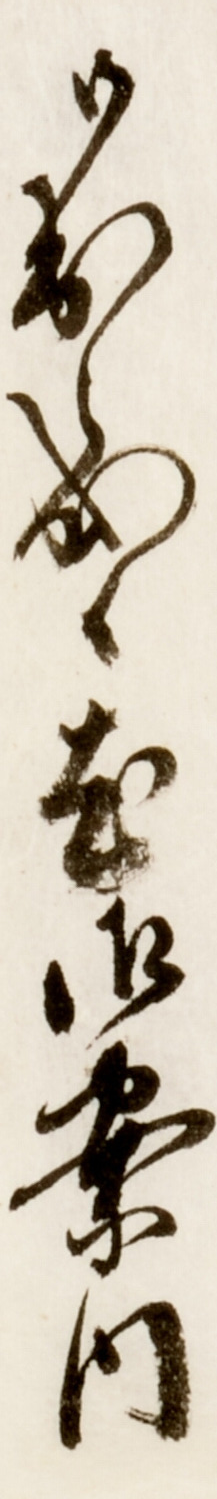御出被成候尤御案内
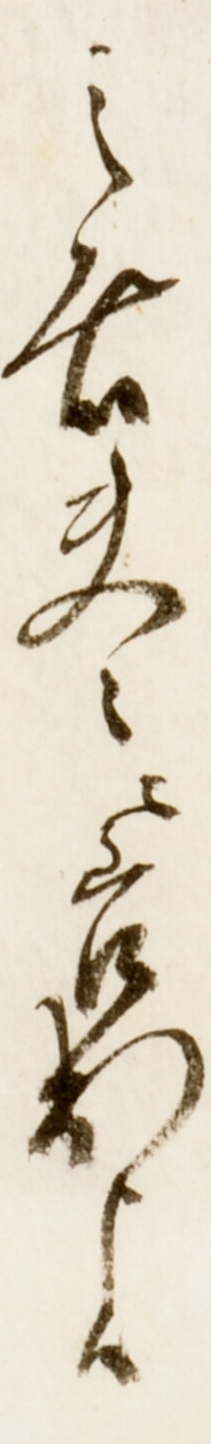之者夫々ニ差出申候
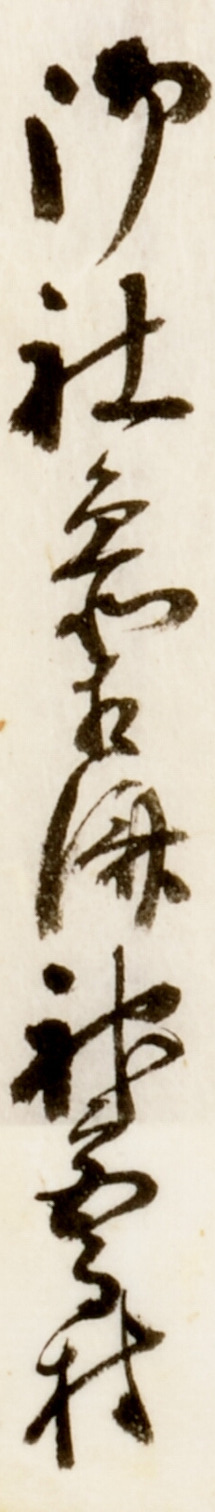御社参相済神宮寺村
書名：覚
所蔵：伊那市立高遠町図書館・合同会社AMANE
